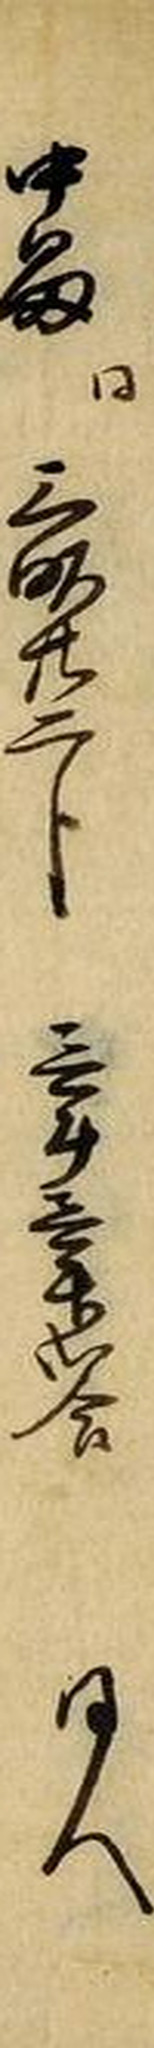中畠同三畝廿二歩壱斗壱升弐合同人
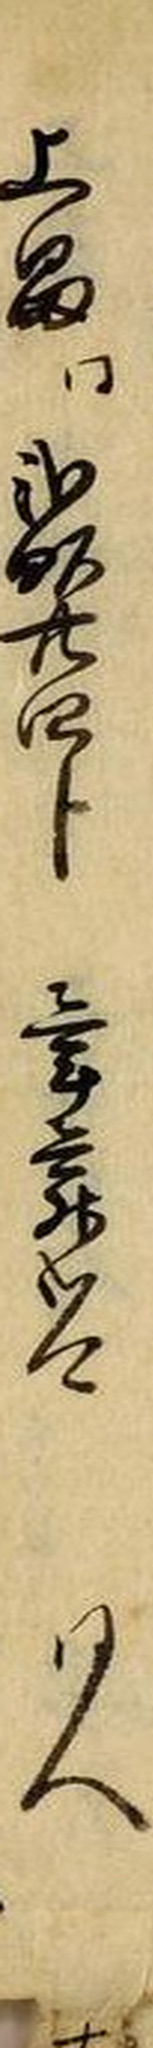上畠同弐畝廿四歩壱斗壱升弐合同人
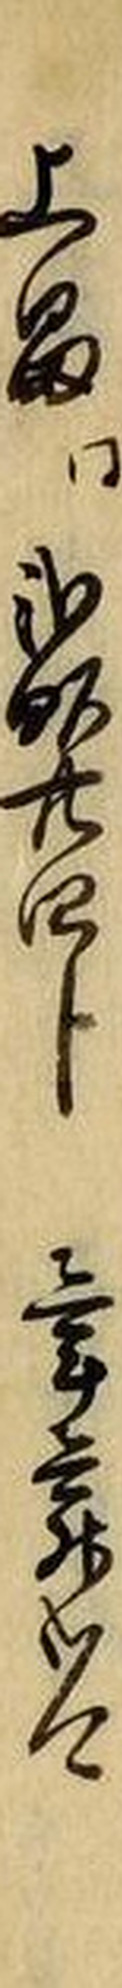上畠同弐畝廿四歩壱斗壱升弐合同人
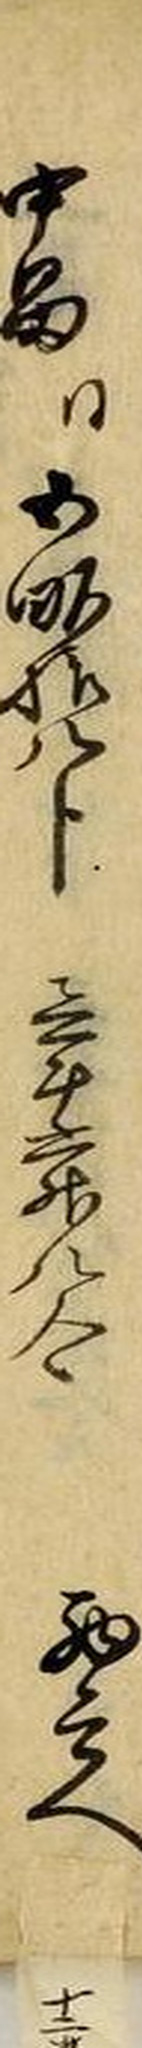中畠同五畝拾八歩壱斗六升八合西兵衛
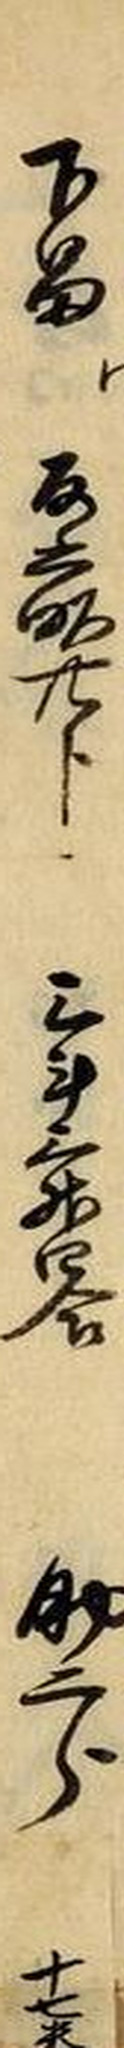下畠同反六畝廿歩三斗三升四合ちか平助二郎
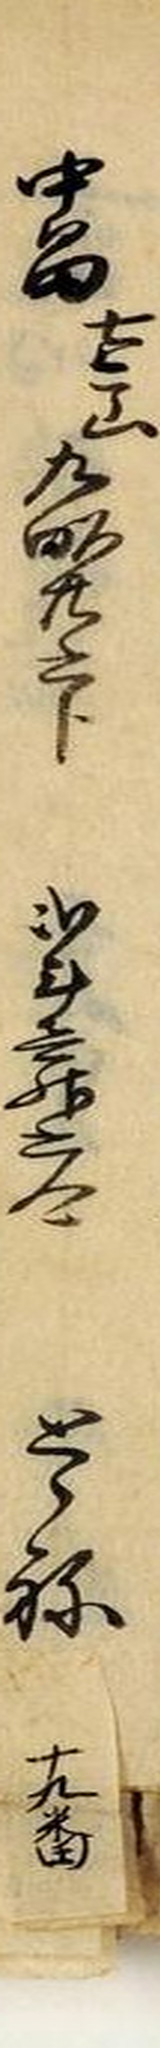中畠山九畝廿六歩弐斗壱升六合ととね
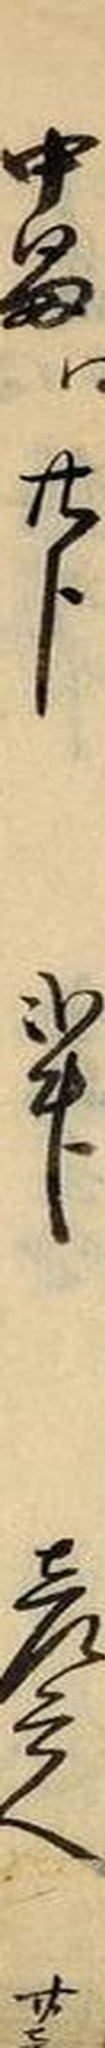中畠同廿歩弐升彦兵衛
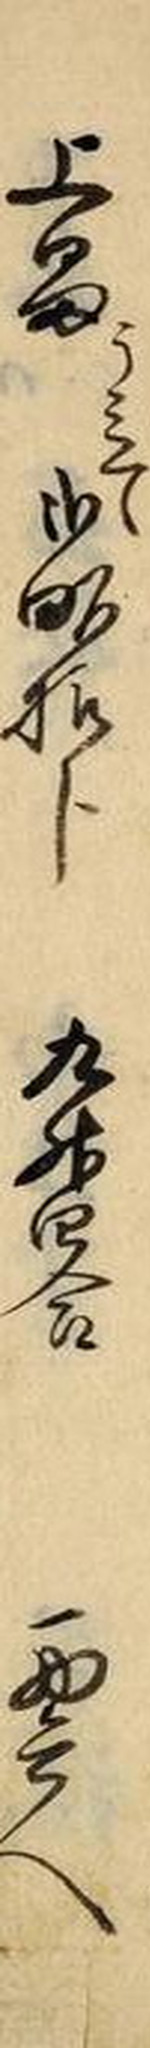上畠うミて弐畝拾歩九升四合西兵衛

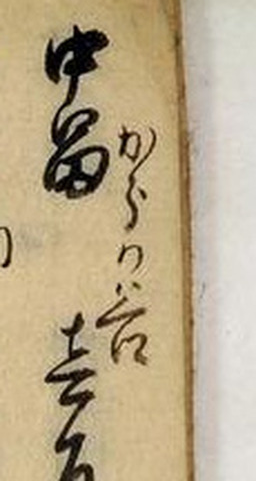からの谷
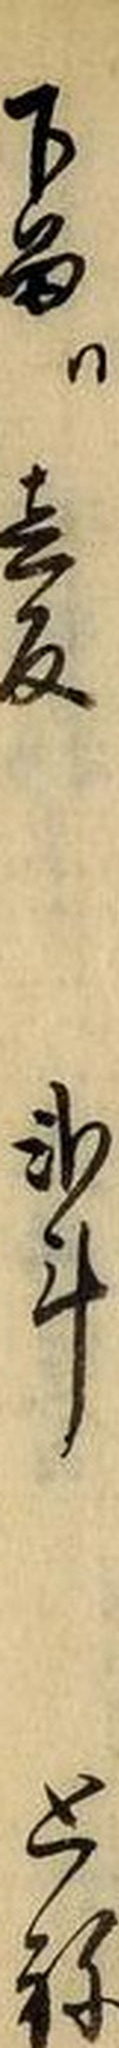上畠同弐反八斗小右衛門
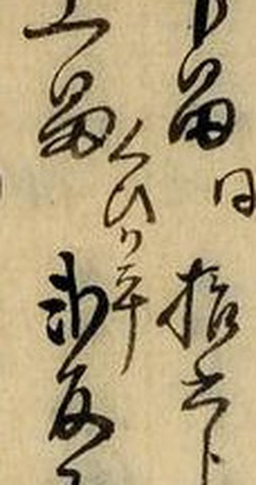くひか平
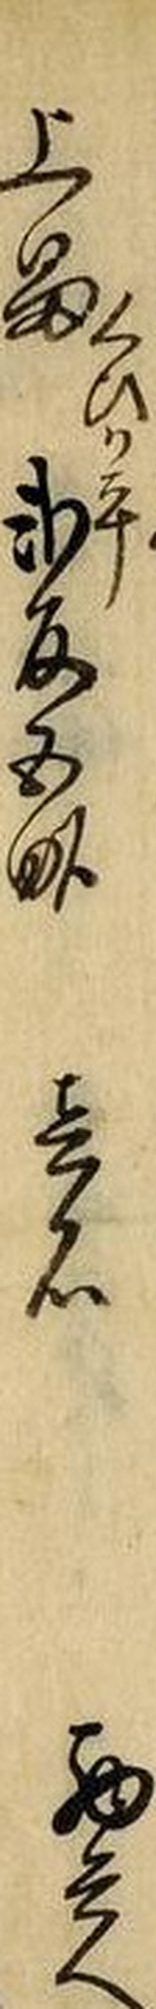上畠弐反五畝壱石西兵へ
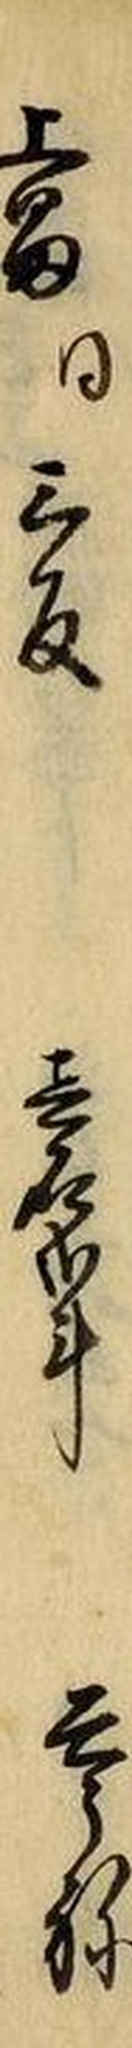上畠同三反壱石弐斗そうね
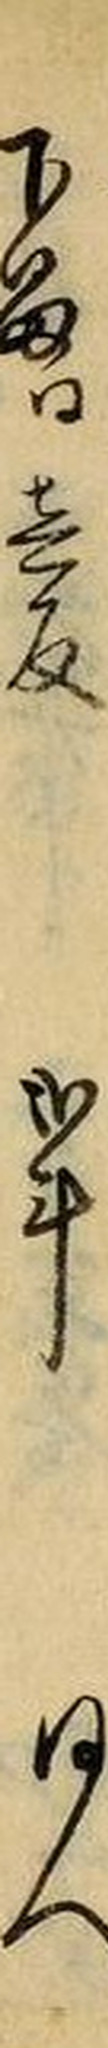下畠同壱反弐斗同人
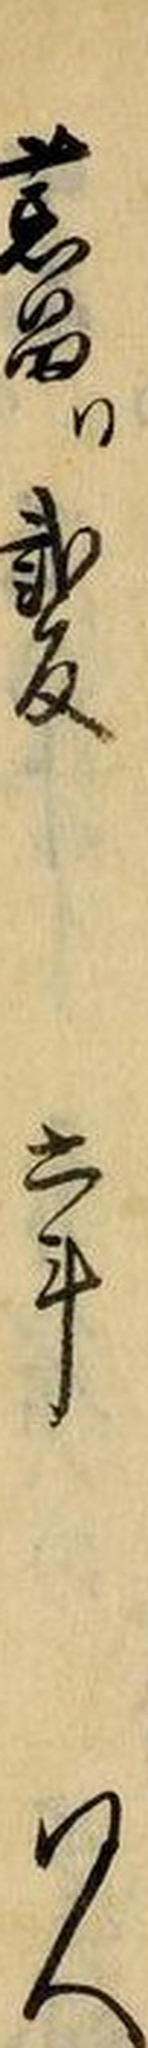荒畠同弍反六斗同人
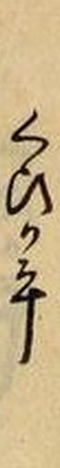くひか平
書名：慶長三年七月越前国丹生郡玉川浦御検地帳写
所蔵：福井県文書館 Fukui Prefectural Archives
